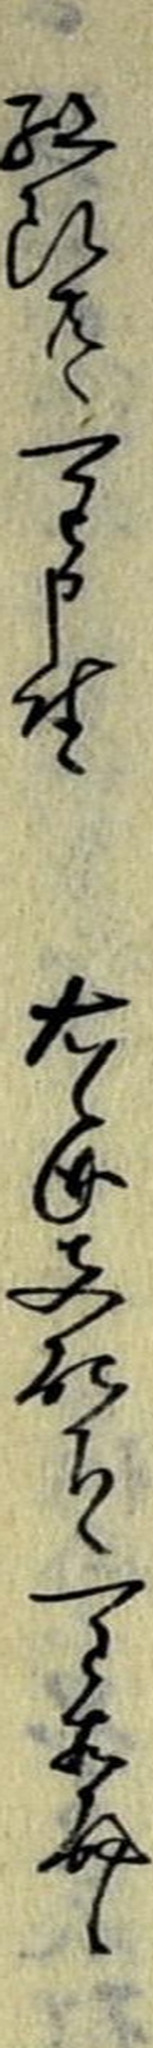組頭共へ可被申付候右之趣支配下へ可相触候
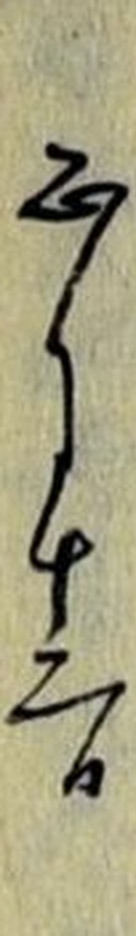正月十二日
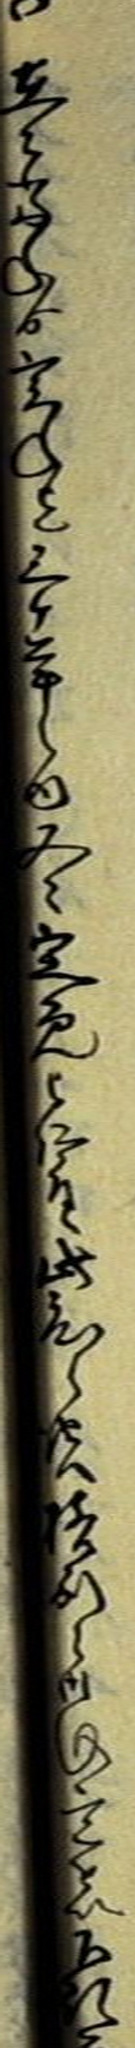〇在々当年ゟ亥年迄三ヶ年之内又々定免被仰付候此度之儀は格別之御趣意を以下行米
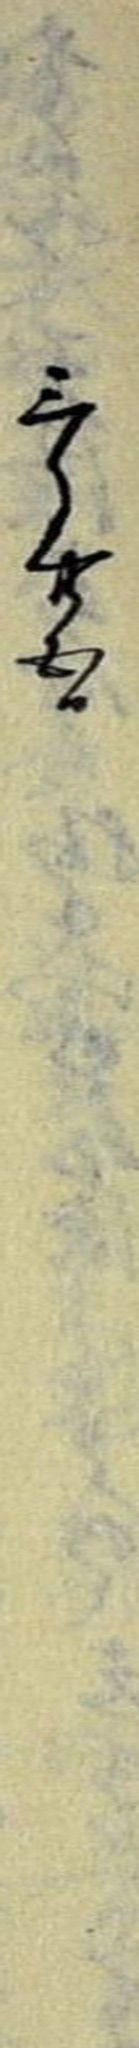三月廿五日
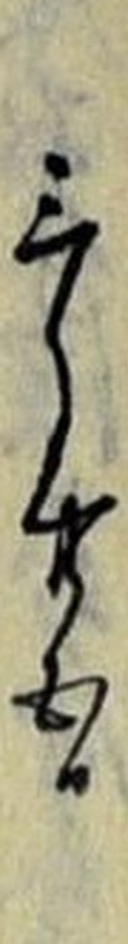三月廿五日
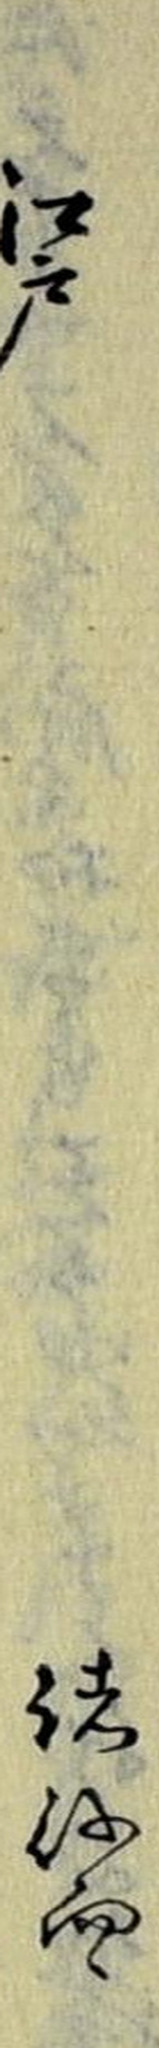江戸諸役向へ
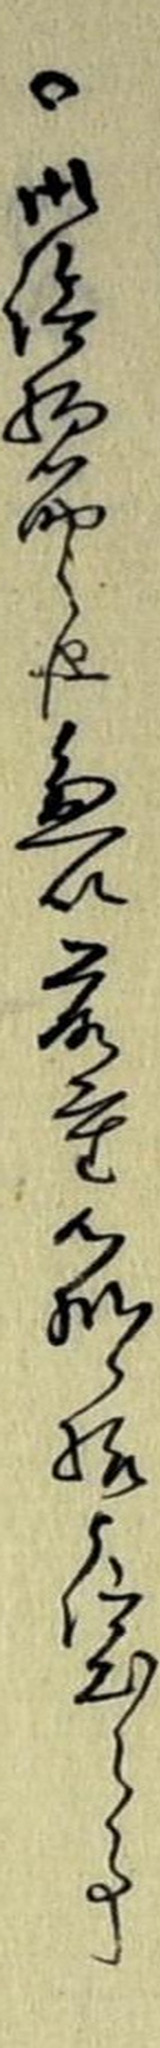〇御倹約筋之儀兼以厳重心掛候様被仰出候事
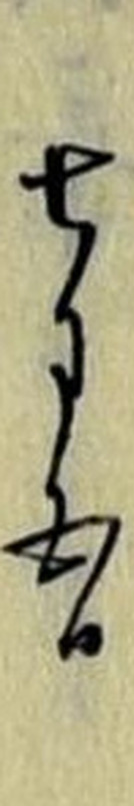七月五日
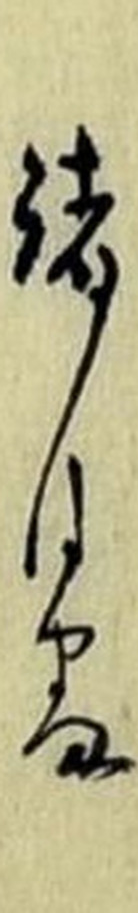諸月番
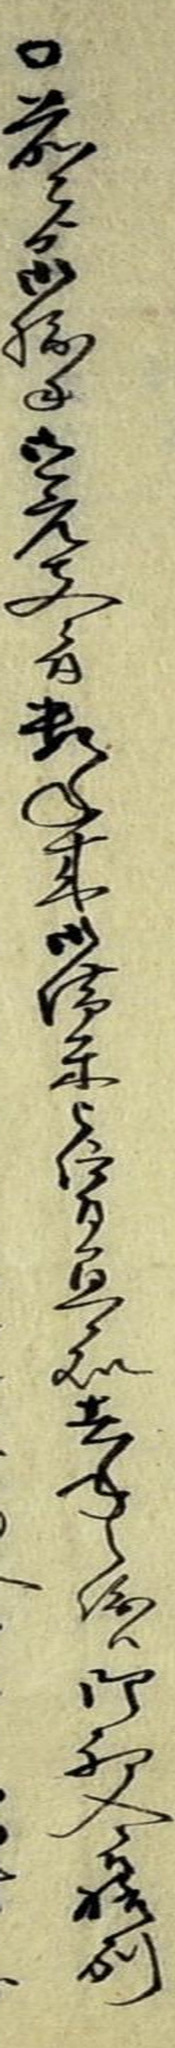〇前々ゟ御勝手御差支に付数年来御借米被仰付置候処去年之儀は御初入に付格別
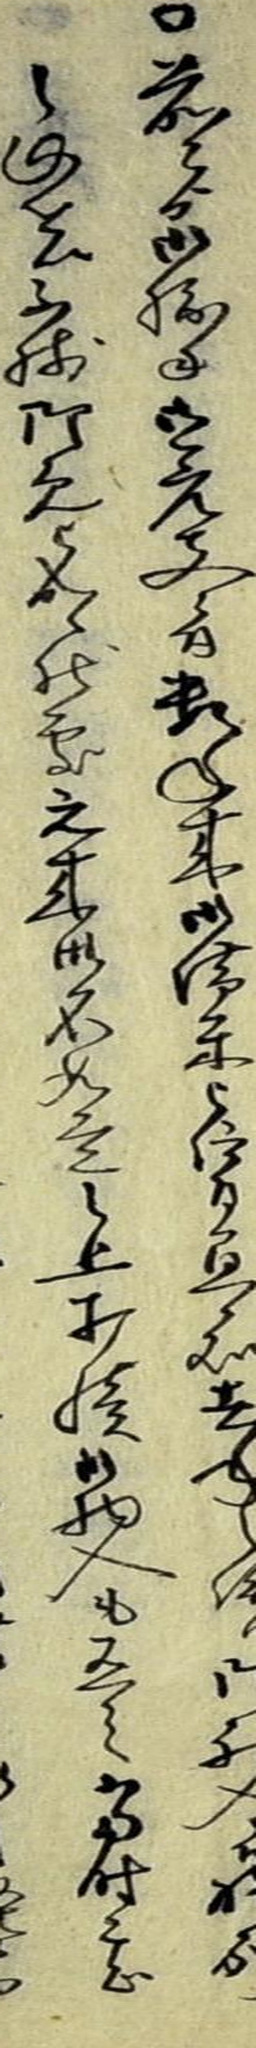之趣を以不残御免被成候然処元来御不如意之上打続御物入も有之当時甚
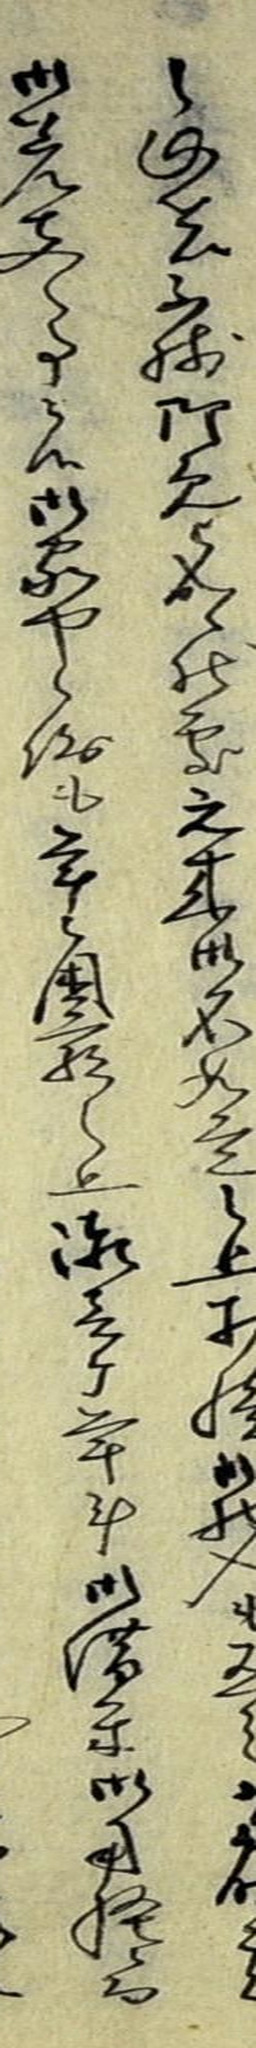御差支之事に候御家中之儀も年々困窮之上漸壱ヶ年斗御借米御用捨に而
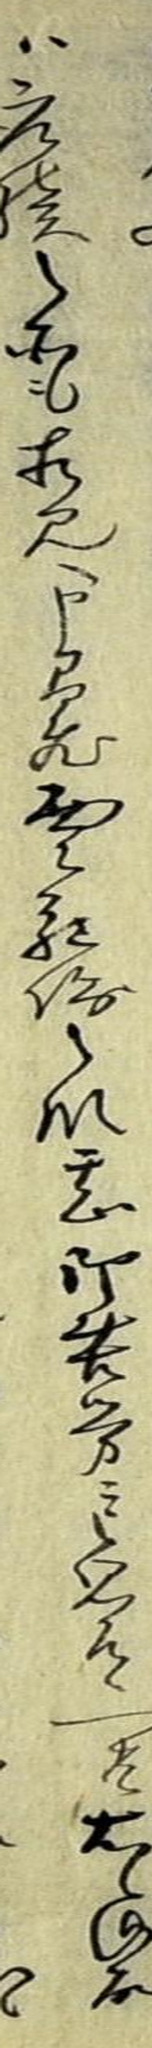は取続之品も相見へ申間敷面々難儀之段甚御苦労に被思召候へ共右之趣故
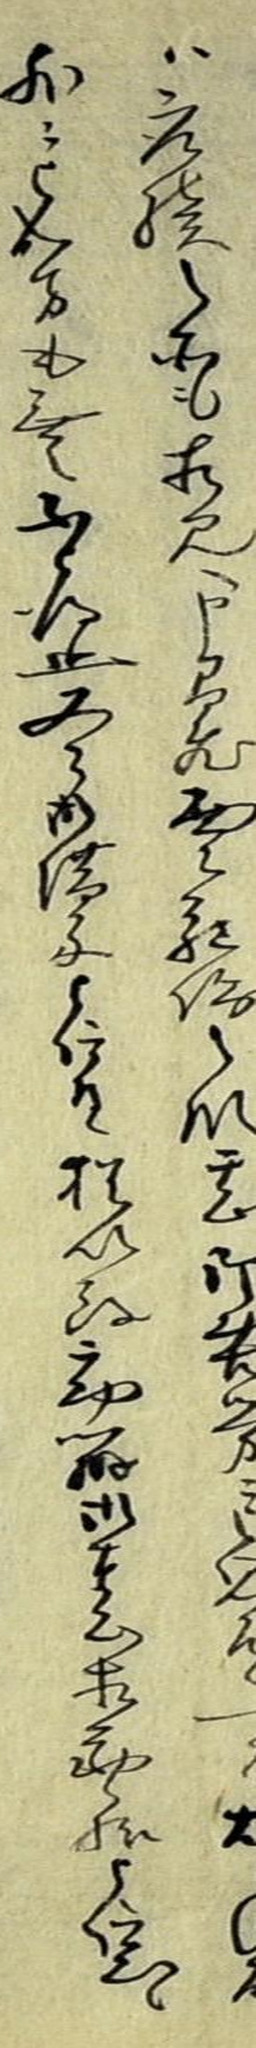外に被成方も無之不被得止又々御借米被仰付候猶以致勘弁御奉公相勤候様被仰付候
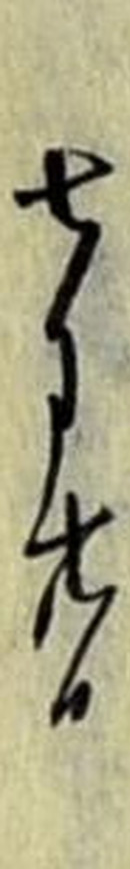七月五日
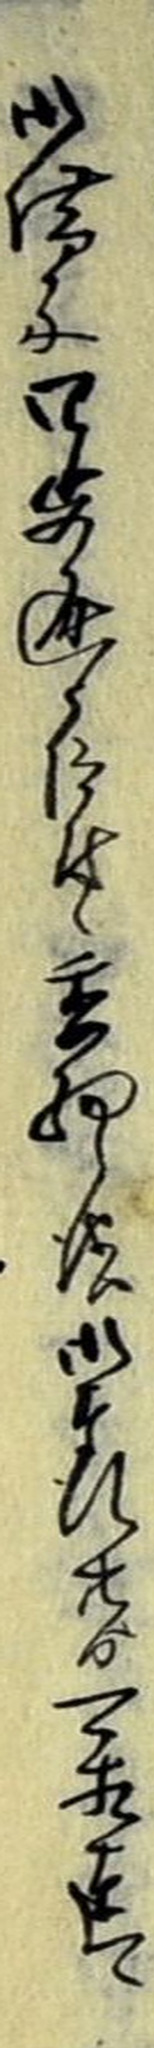御借米四歩通被仰付候委細之儀は御奉行共ゟ可相達候
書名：命令之部 二
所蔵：福井県文書館 Fukui Prefectural Archives
